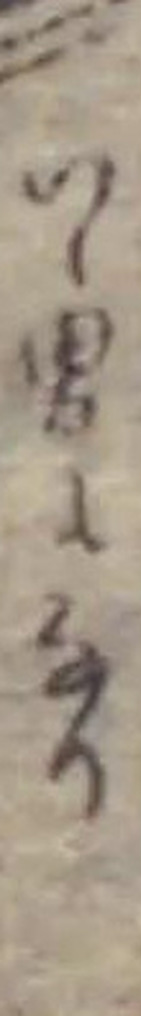いゝ男になり
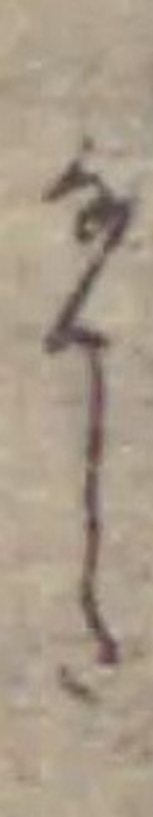なんした
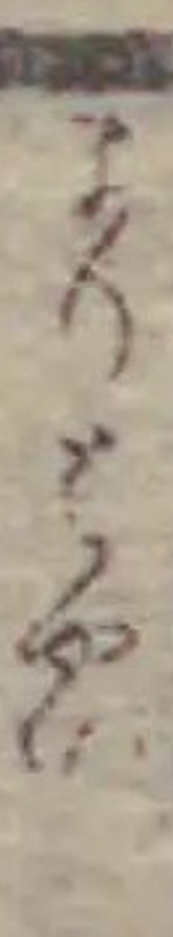まりはやい
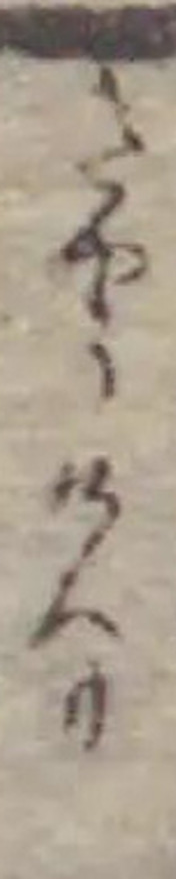きやうけんサ
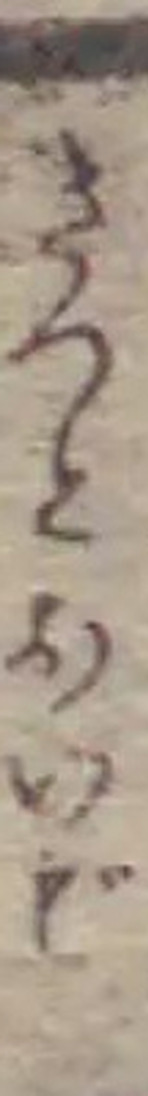きつとおいで
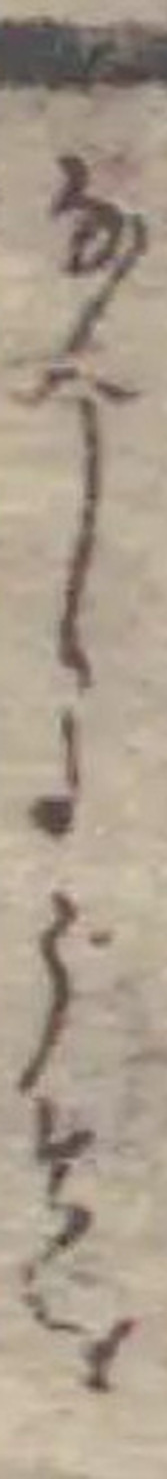なんしようそを
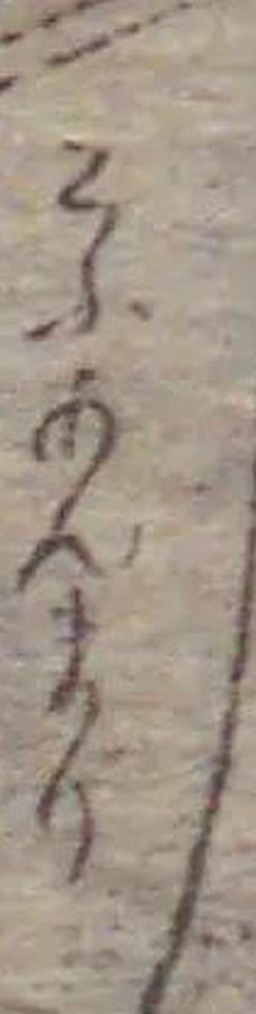こふあんまり
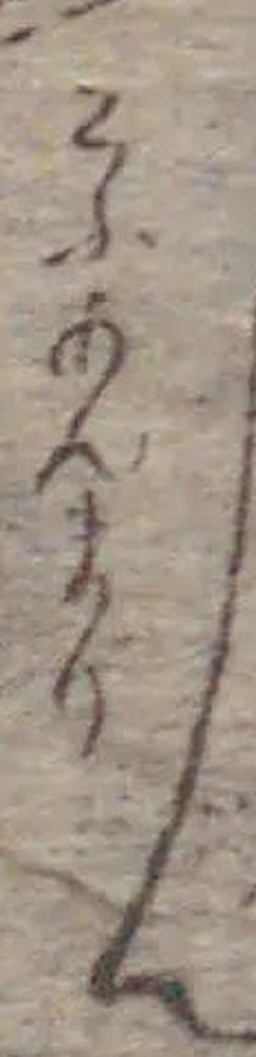こふあんまり
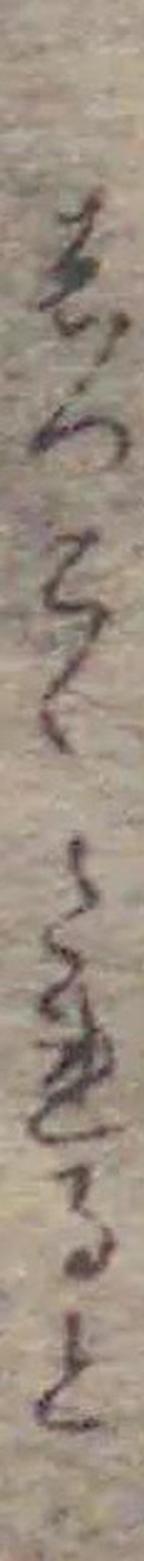しつこくされると
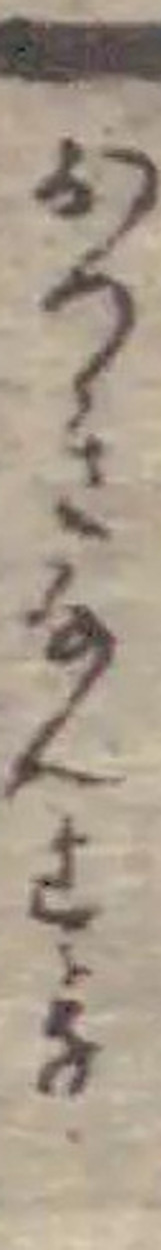おつきなんすな
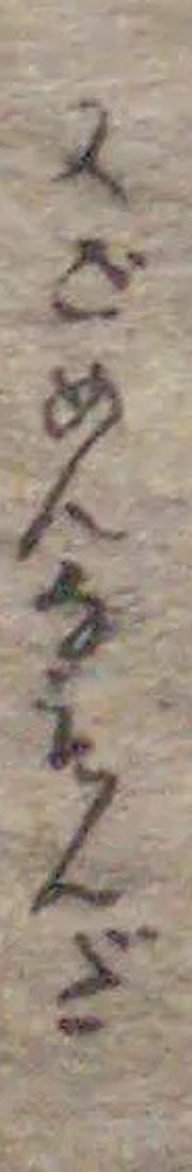又ごめんなもんだ

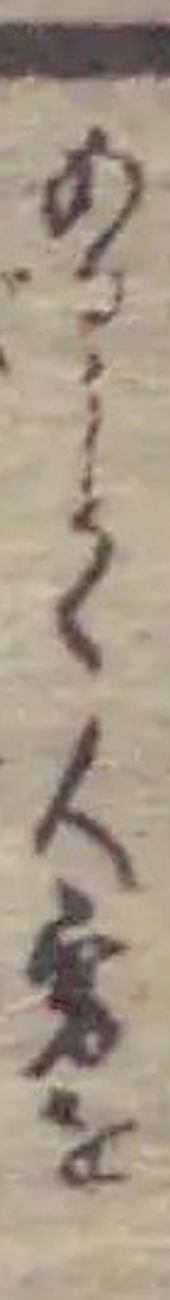あるうとく人客を
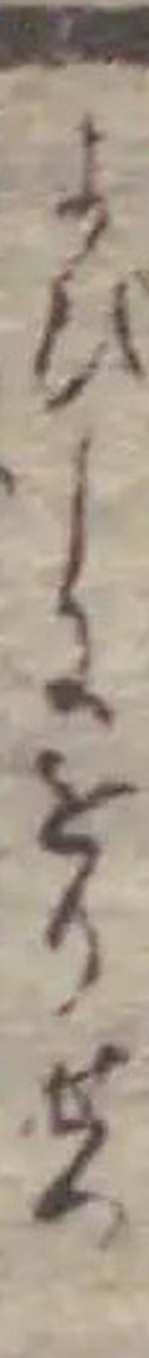よびしにをりせつ
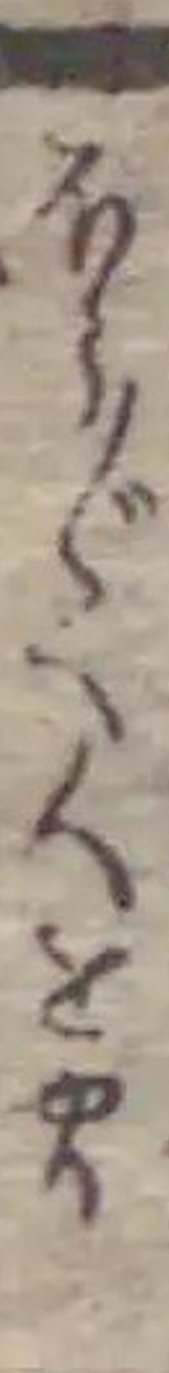ほう〴〵へ人をやり
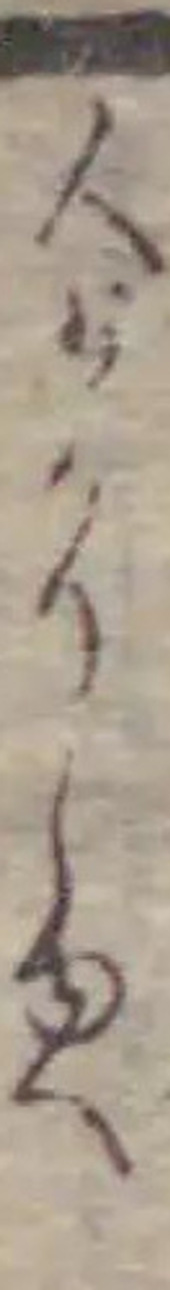人かりしゆへ
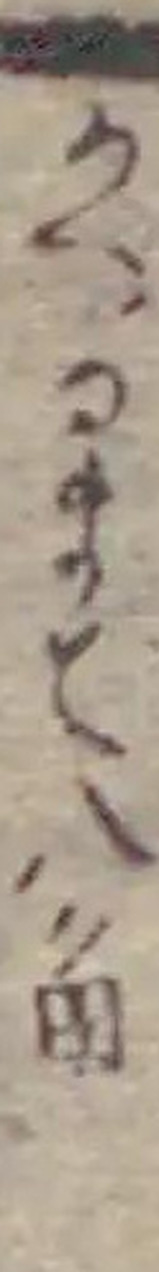かへるまて八角
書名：栄増眼鏡徳 3巻
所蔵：国立国会図書館 National Diet Library, JAPAN
